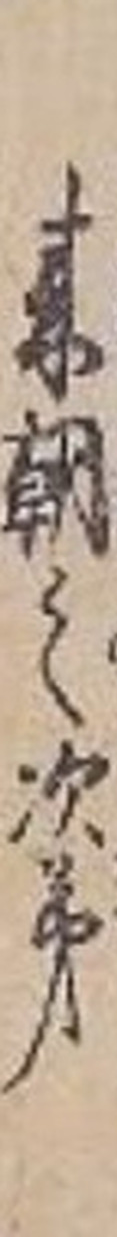来朝之次第
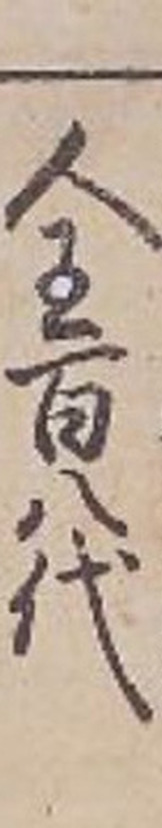人王百八代
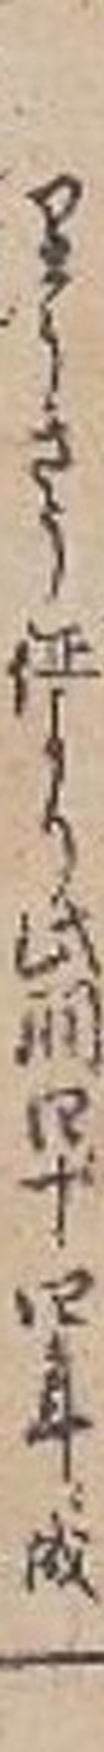りうきう征より此間四十四年に成
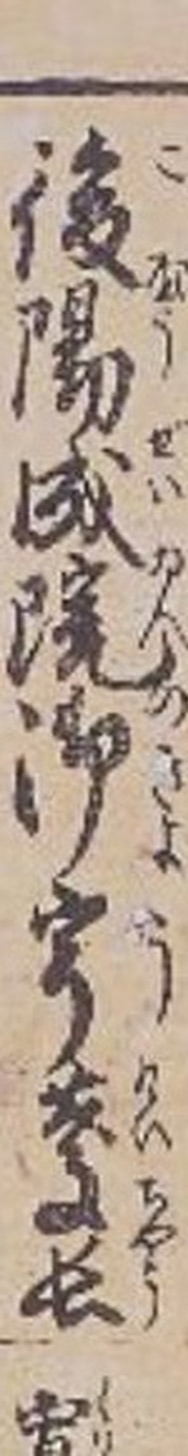後陽成院御宇慶長
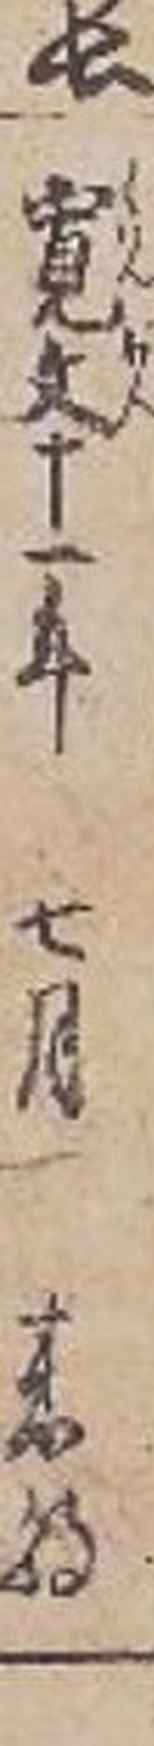寛文十一年七月来朝
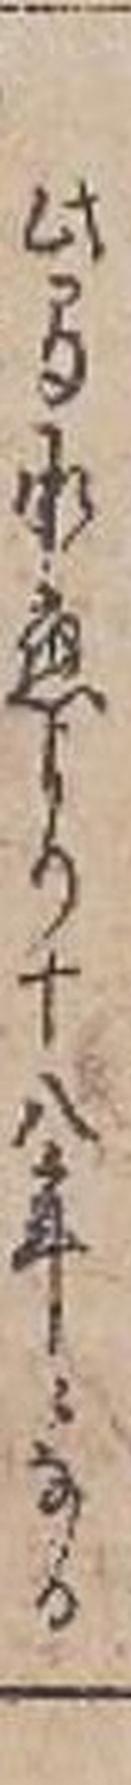此間承應より十八年になる
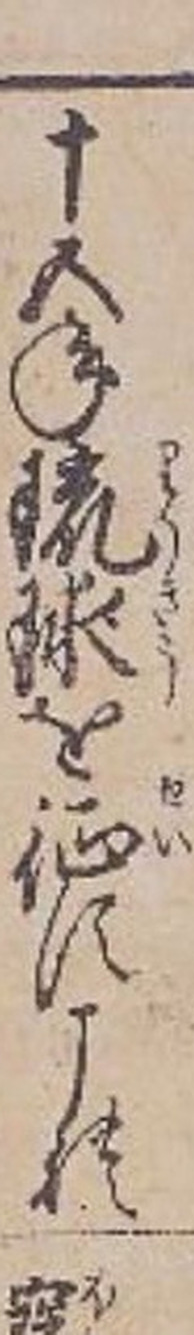十五年琉球を征すこれ
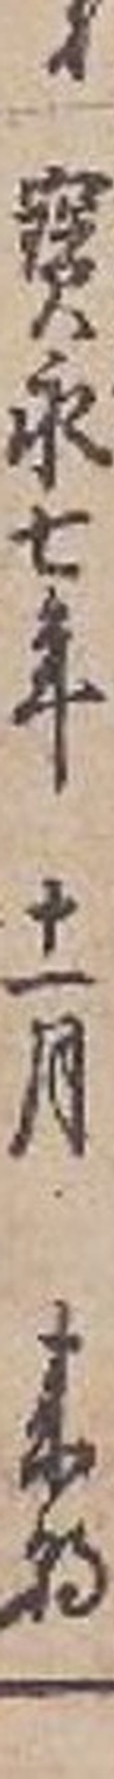寶永七年十一月来朝
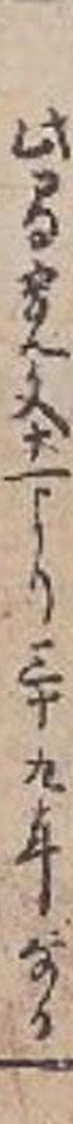此間寛文十一より三十九年になる
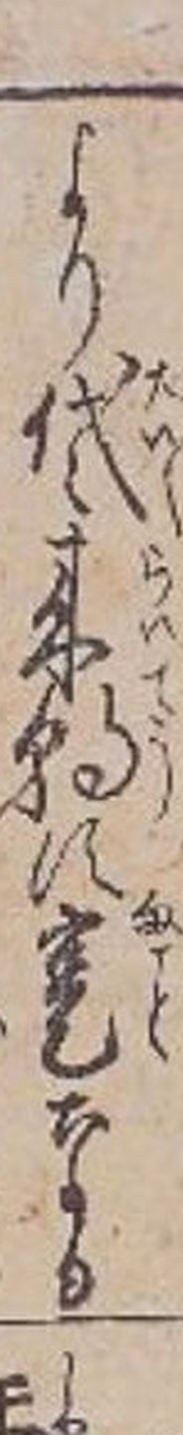より代々来朝す實なる
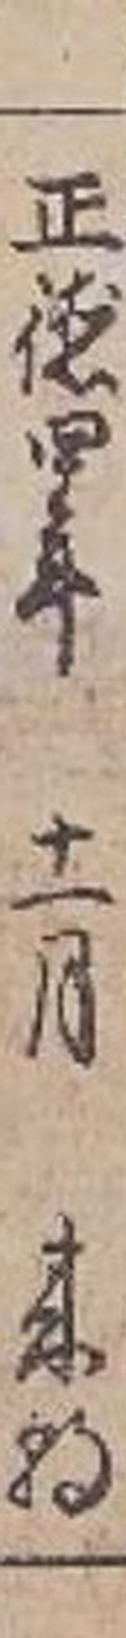正徳四年十一月来朝
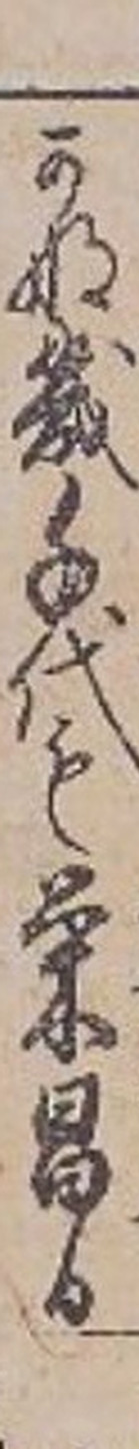かな幾千代を栄昌る
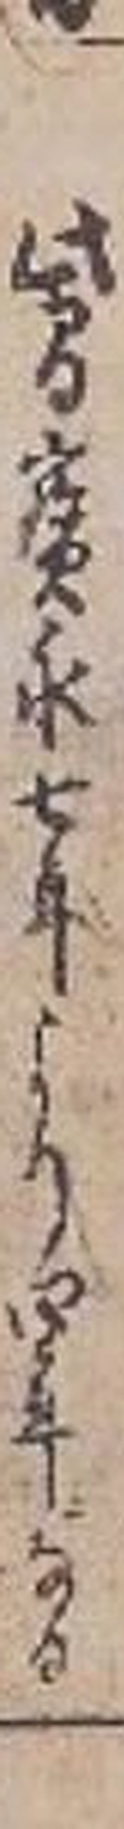此間寶永七年より四年になる
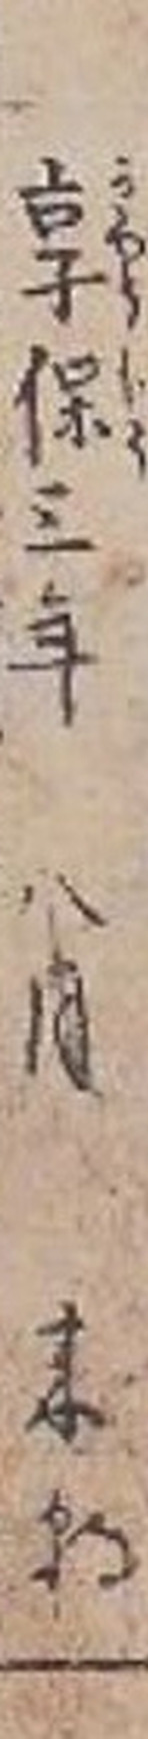享保三年八月来朝
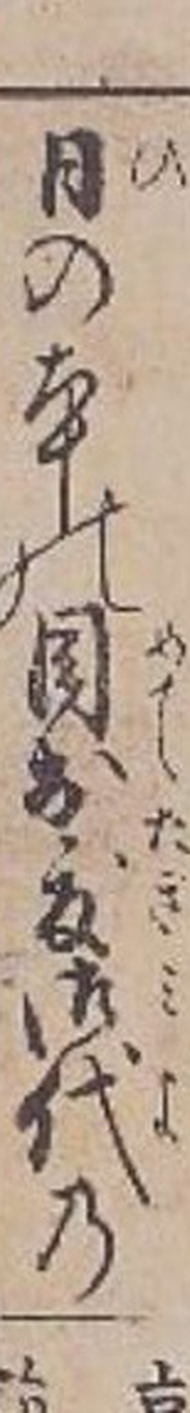日の本の目出度御代の
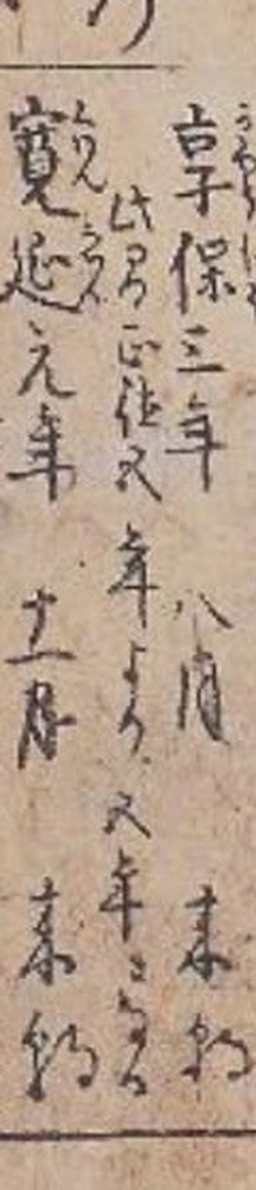此間正徳五年より五年になる
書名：琉球人大行列記 来朝新板絵入
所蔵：University of the Ryukyus Library
